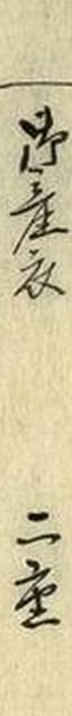御産衣二重
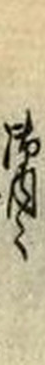御内々
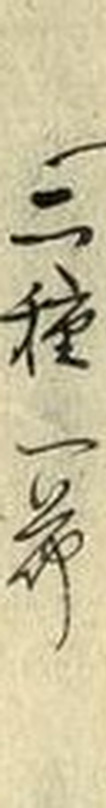二種一荷
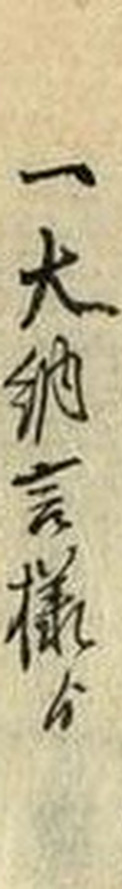一大納言様ゟ
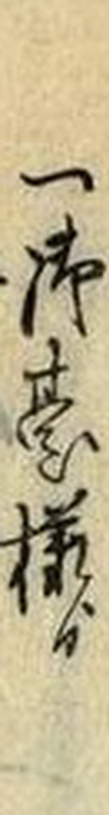一御台様ゟ
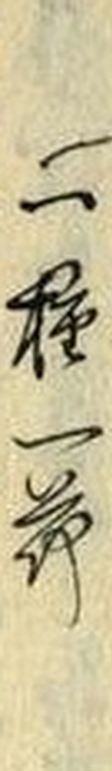一種一荷
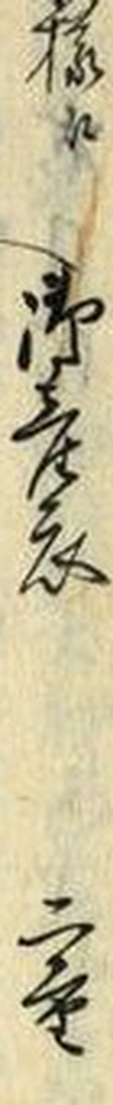御産衣二重
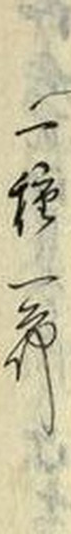一種一荷
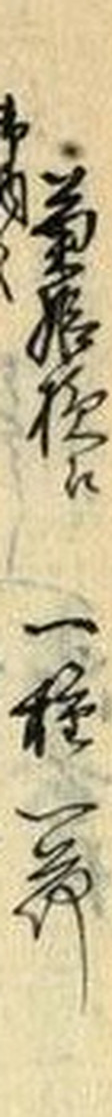菊姫様江一種一荷
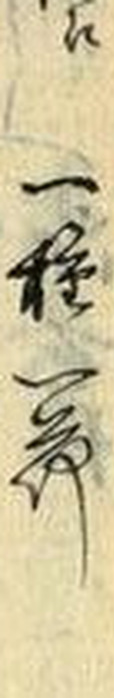一種一荷
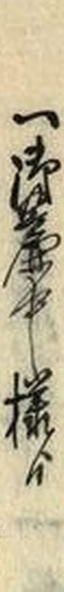一御簾中様ゟ
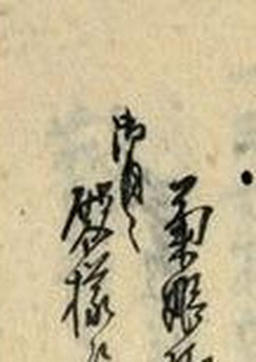御内々
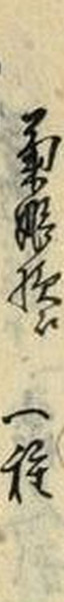菊姫様江一種

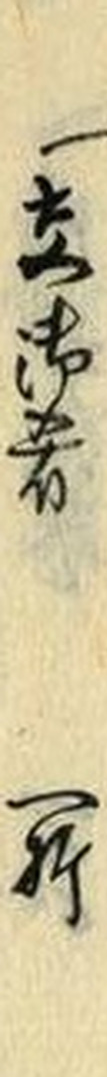交御肴一折
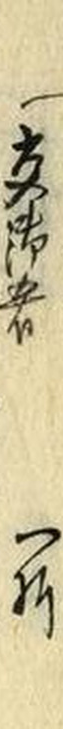交御肴一折
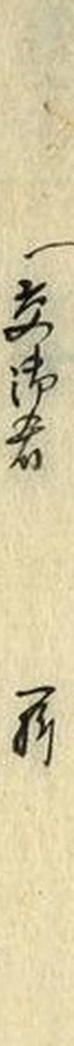交御肴一折
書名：少傅日録抄（斉承付側向頭取日記、在府）
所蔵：福井県文書館 Fukui Prefectural Archives
